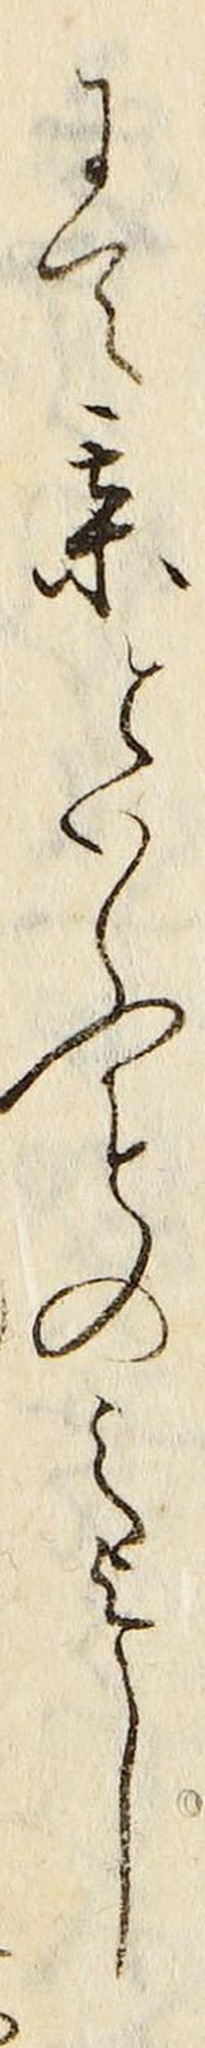にて某といふもの之よし
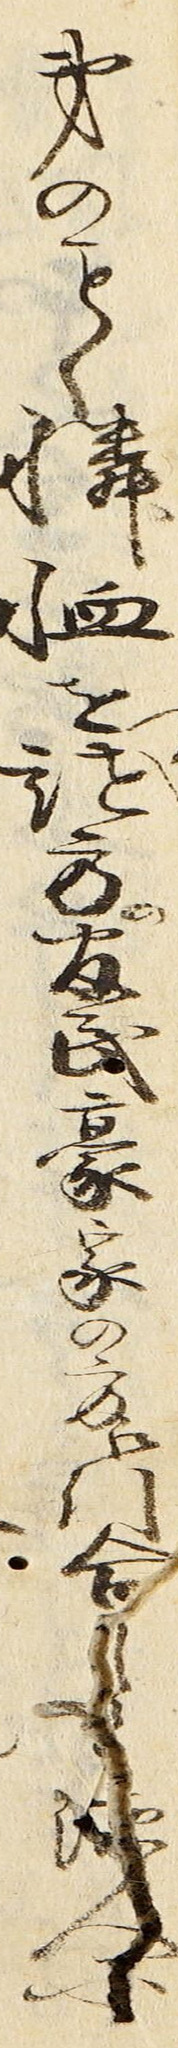弟のことく憐恤を施し諸方の官民豪家の方え引合漂人に
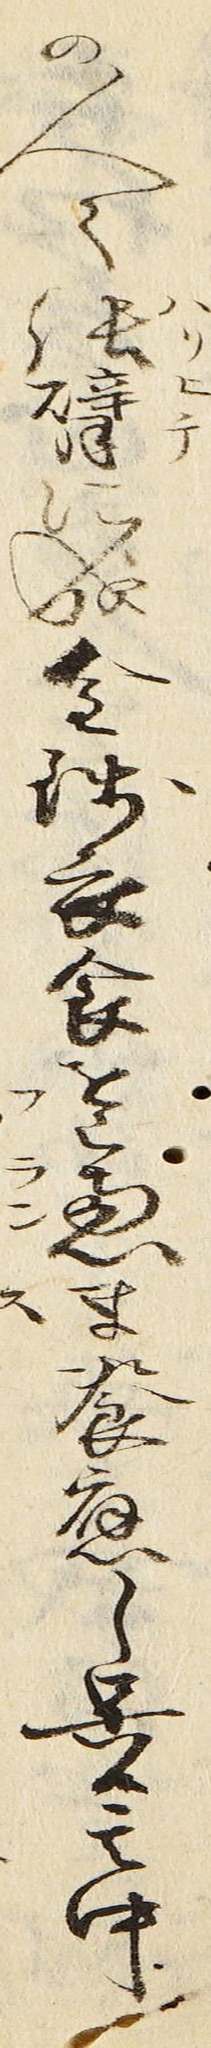の人々張臂に成金銭衣食を被恵ま饗応し呉候其中
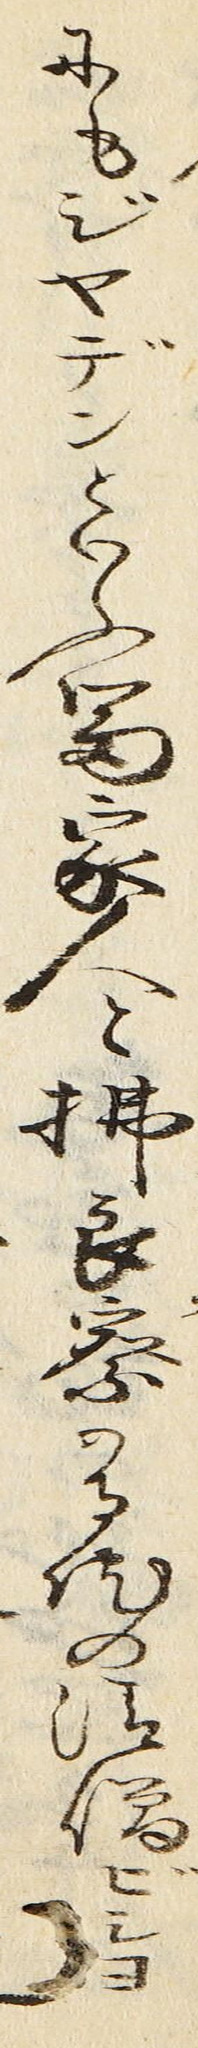にもジヤデンといふ富家人と払良察の寺院の清僧ビジヨ
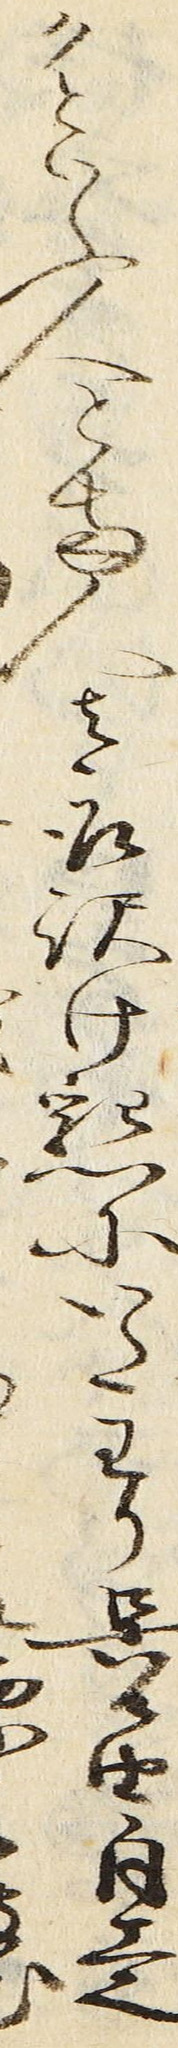クといふ人と両人は取訳け懇にいたわり呉候由自走
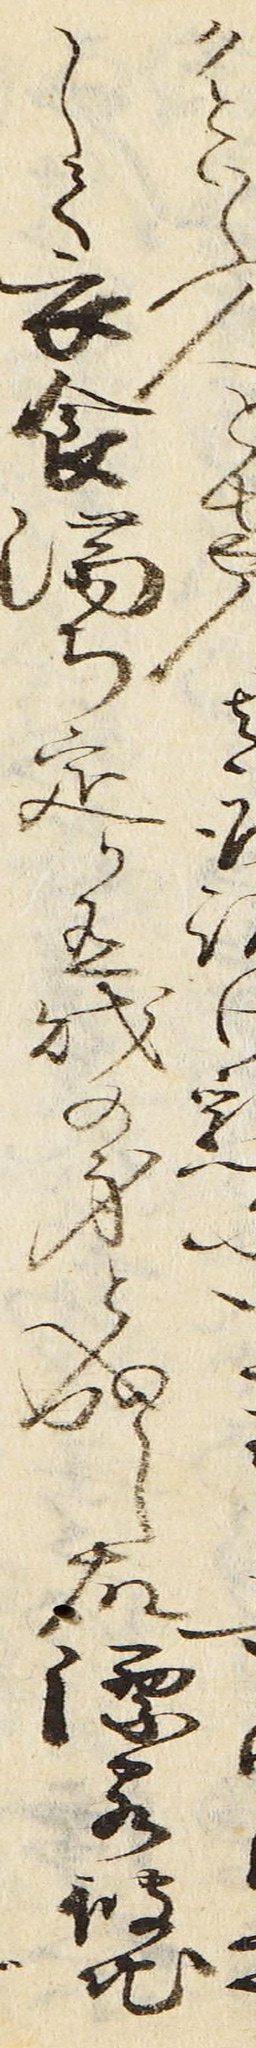して衣食満ち足り有財の身と成し故漂客彼地
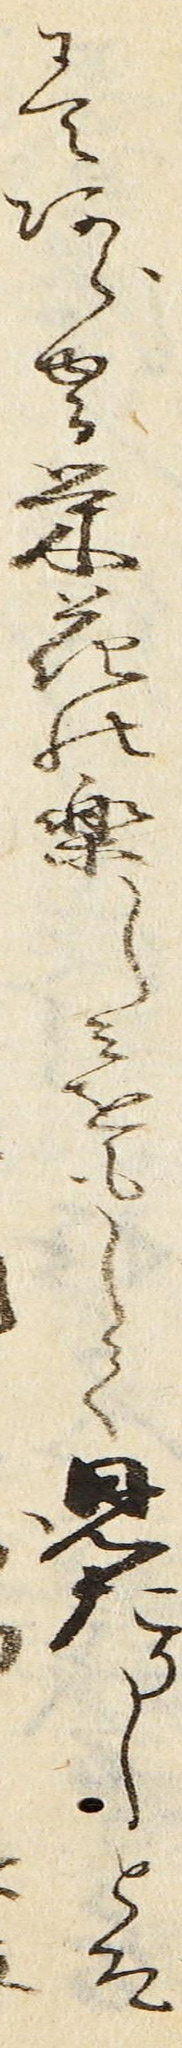にてあらゆる栄花の楽しミをもして見たりしとぞ
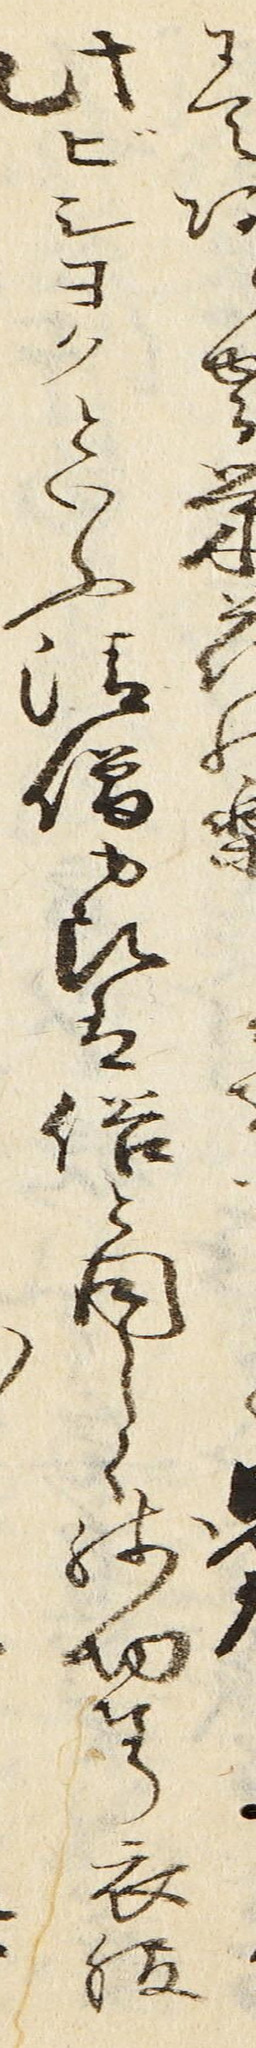此ビシヨクといふ清僧も頭は俗と同しく残切なり衣服
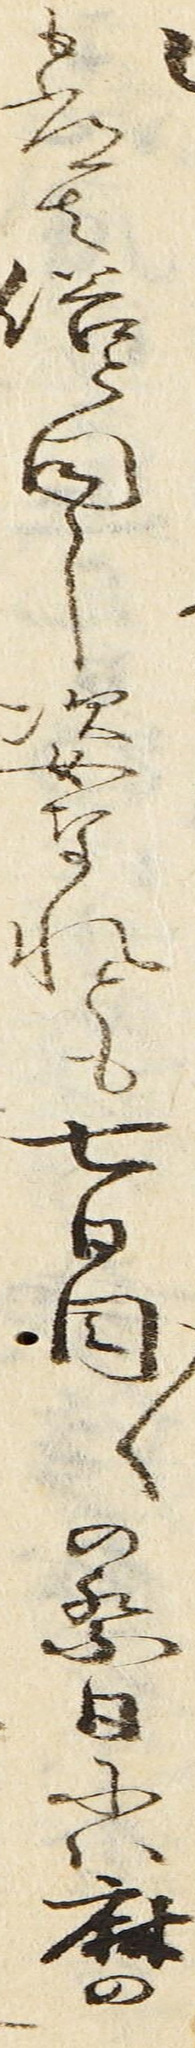も常は俗と同し姿なれとも七日目〳〵の祭日にハ麻の
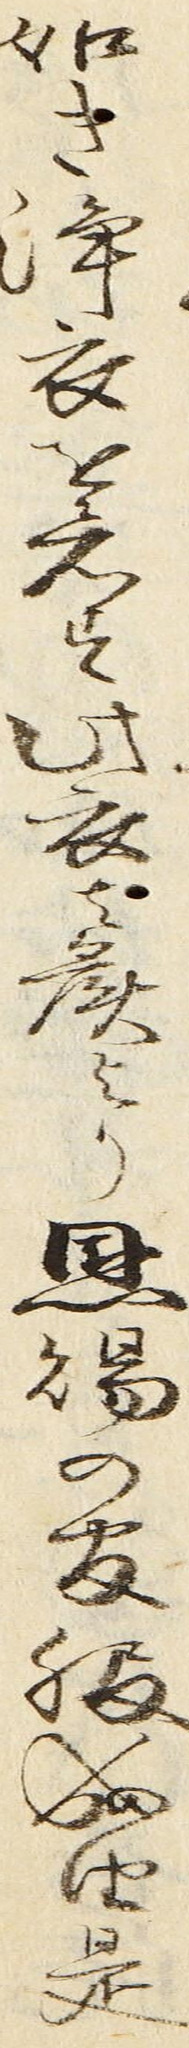如き浄衣を着す此衣は侯より恩賜の官服成由是
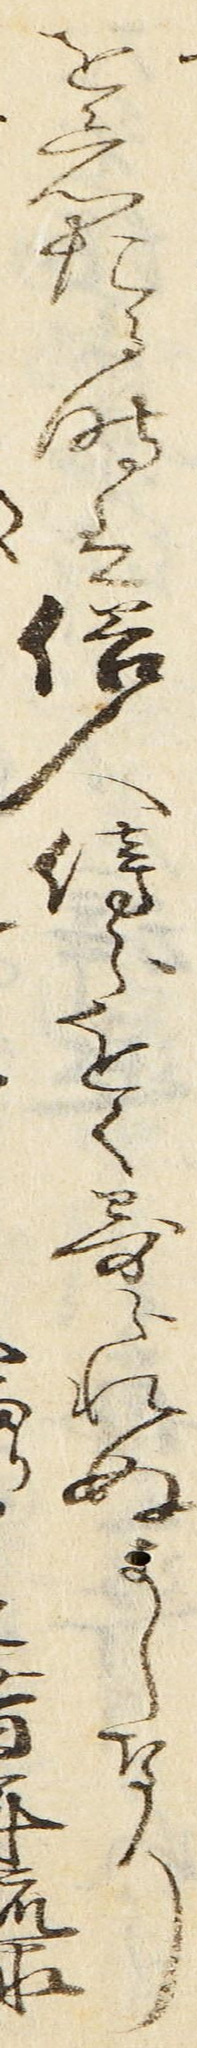を着たる時は俗人傍ら近く寄られぬよしなり
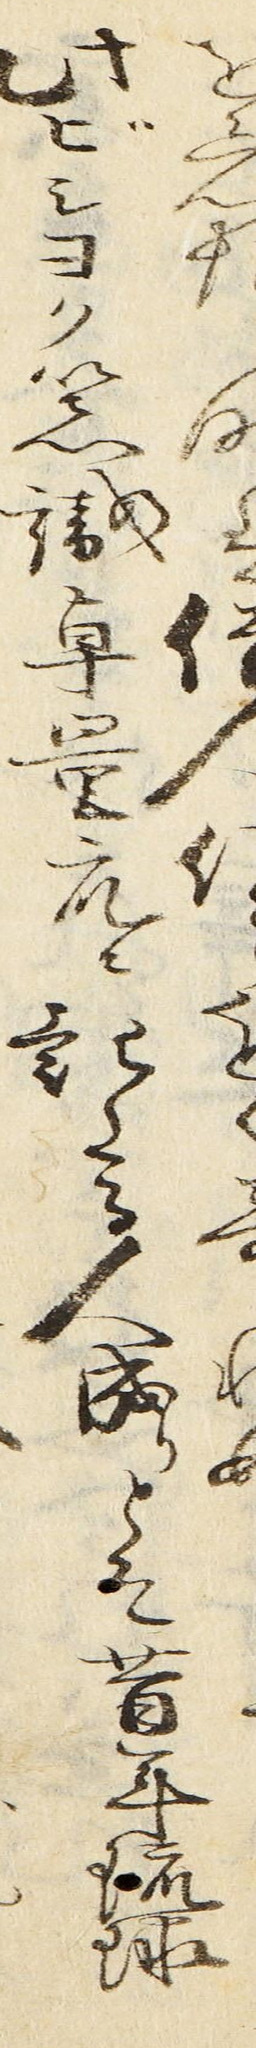此ビシヨク器識卓量衆ニ起たる人成りとそ昔年琉球
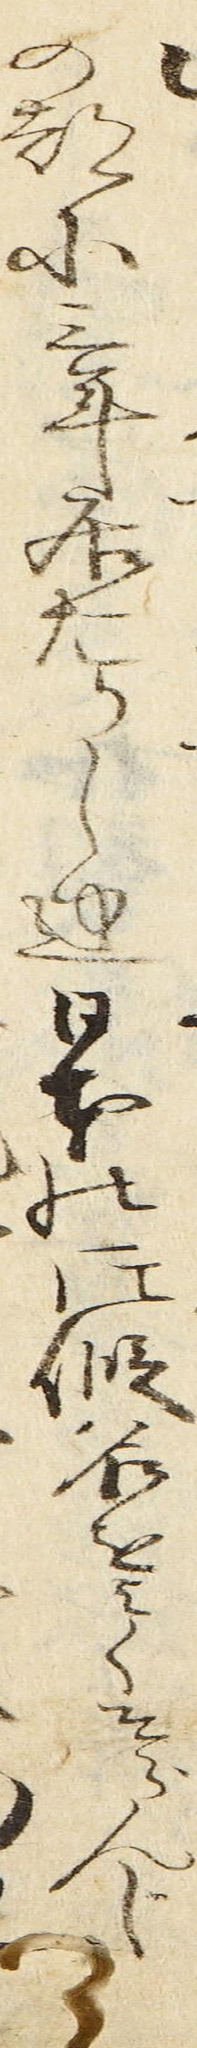の都に三年居たりし迚日本の片假名をよくそらんじ
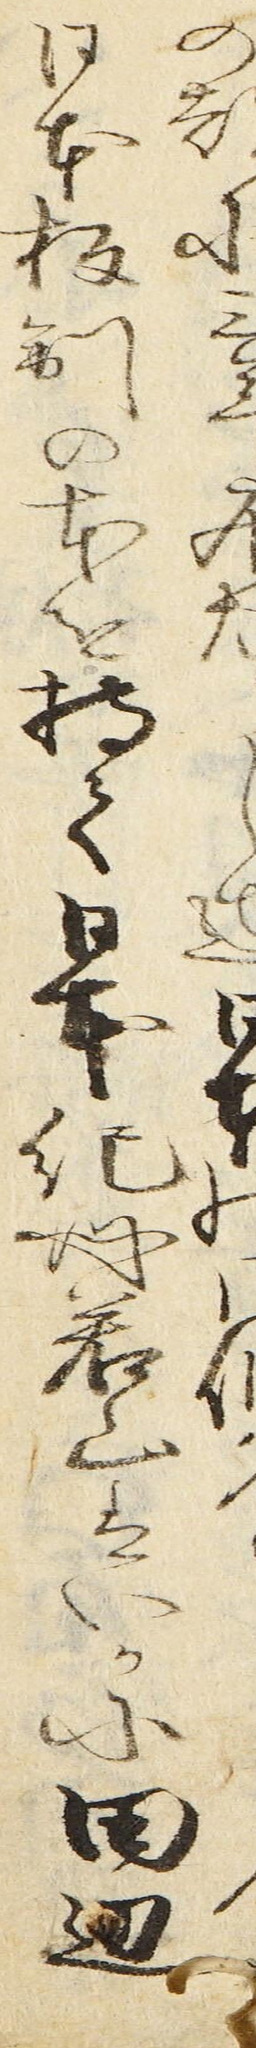日本板制の本を持て日本紀州若山はいかに田辺

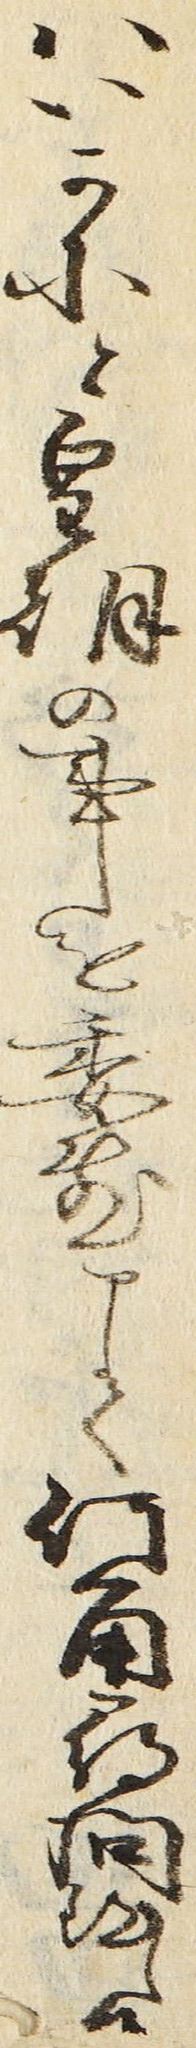ハいかにと皇朝の事を委敷申て何角尋問致し候
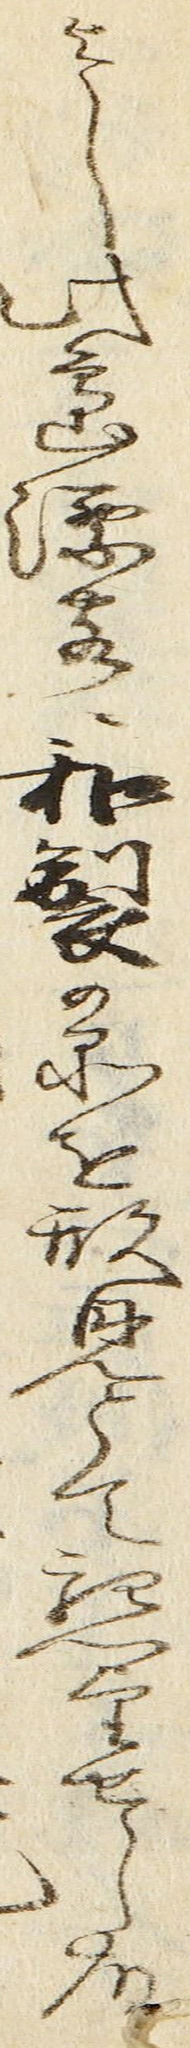よし此島漂客ニ和製の品を形見とて懇望せし故
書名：亜墨利加漂流記聞
